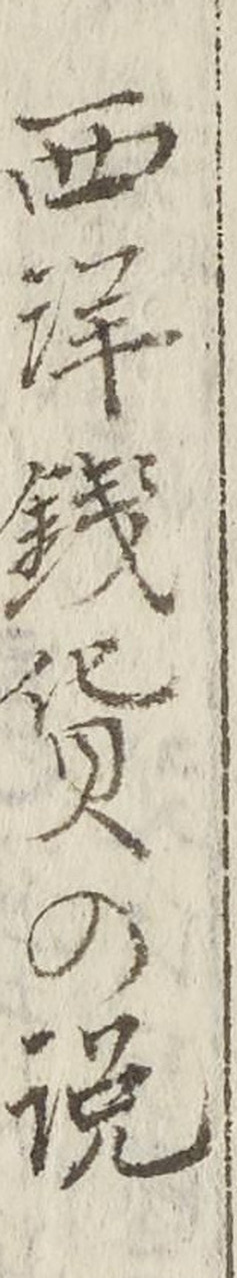西洋銭貨の説
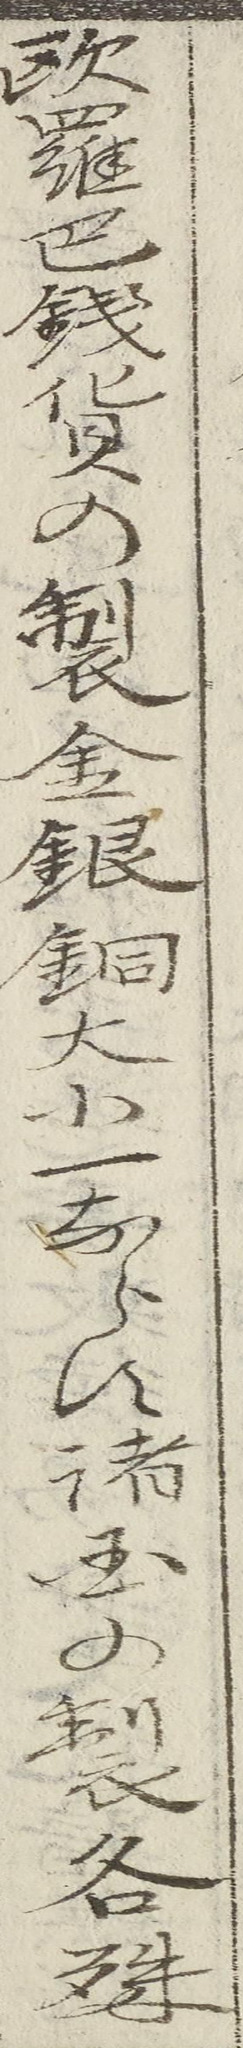欧羅巴銭貨の製金銀銅大小一ならす諸国の製各殊
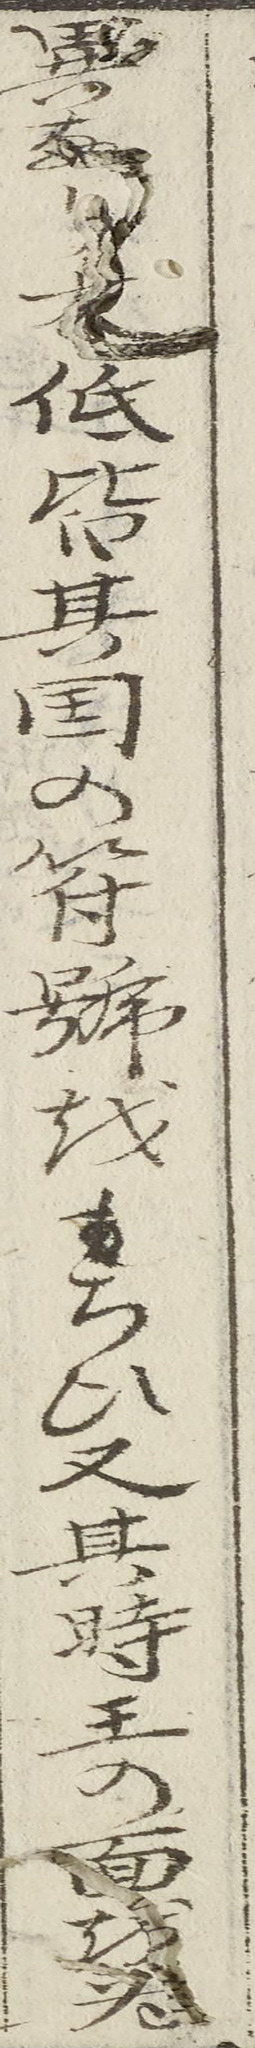異なり其低皆其国の符号をもちひ又其時王の面を為
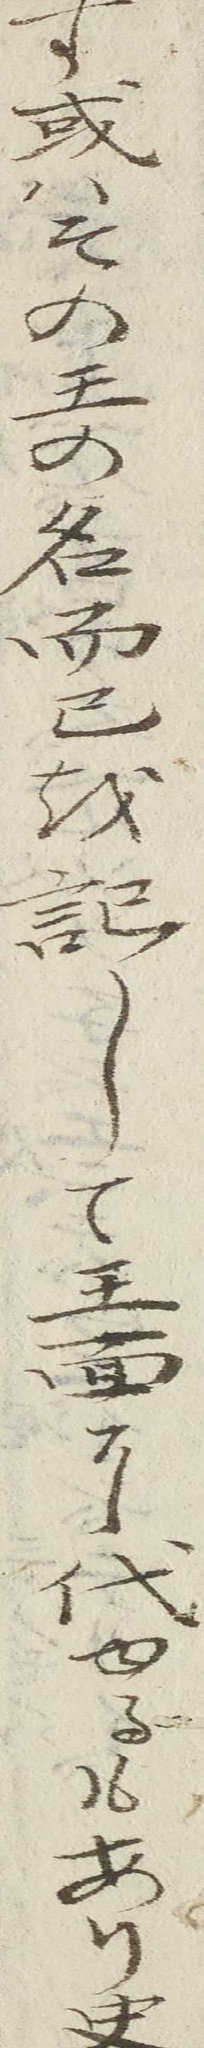す或ハその王の名而己を記して王面に代ゆるもあり史
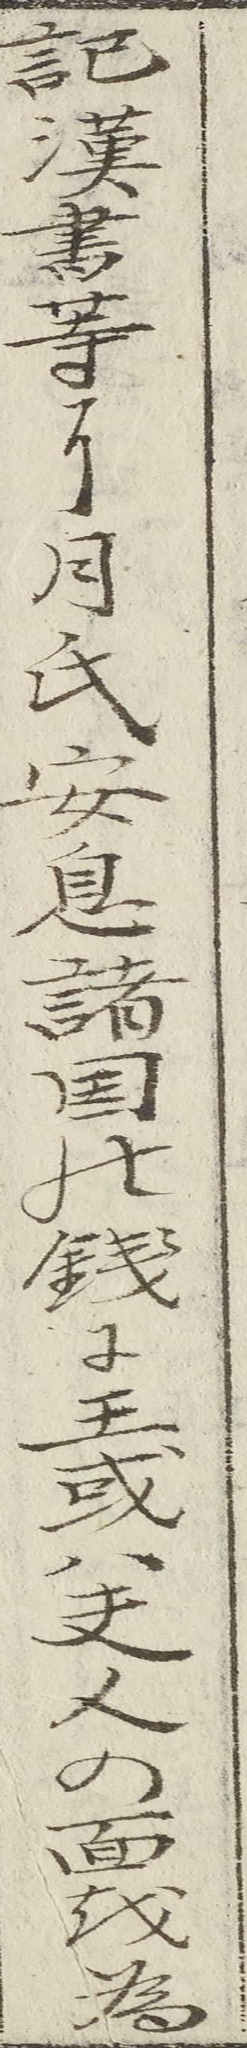記漢書に月氏安息諸国の銭に王或ハ夫人の面を為
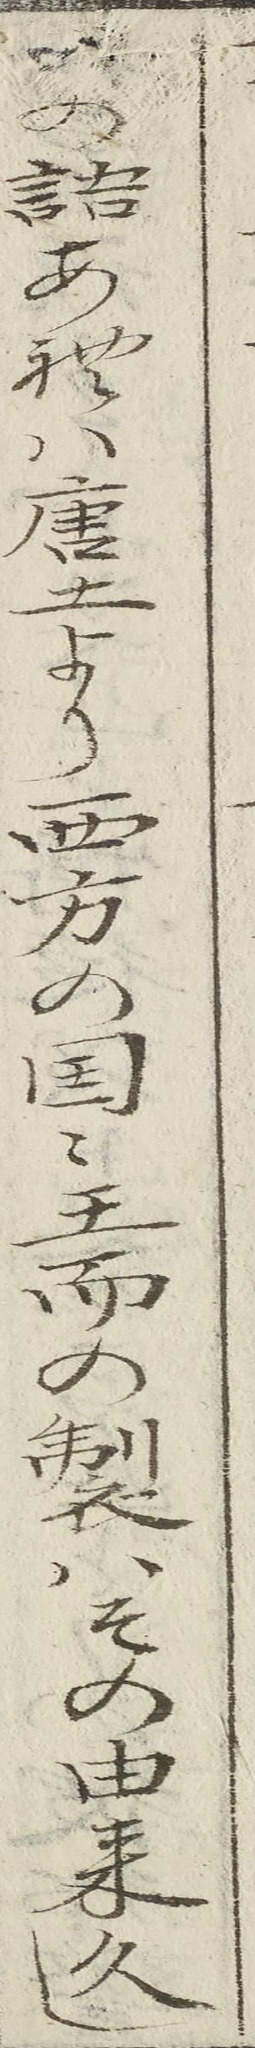すの語あれハ唐土より西方の国々王而の製ハその由来久し
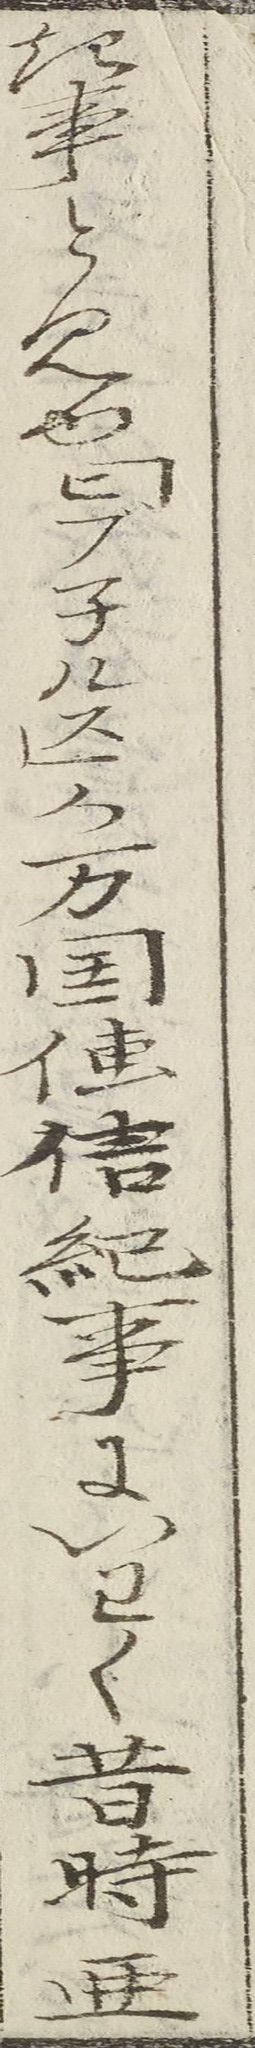き事とめゆ「ヒブ子ルス」か万国伝信紀事にいわく昔時亜
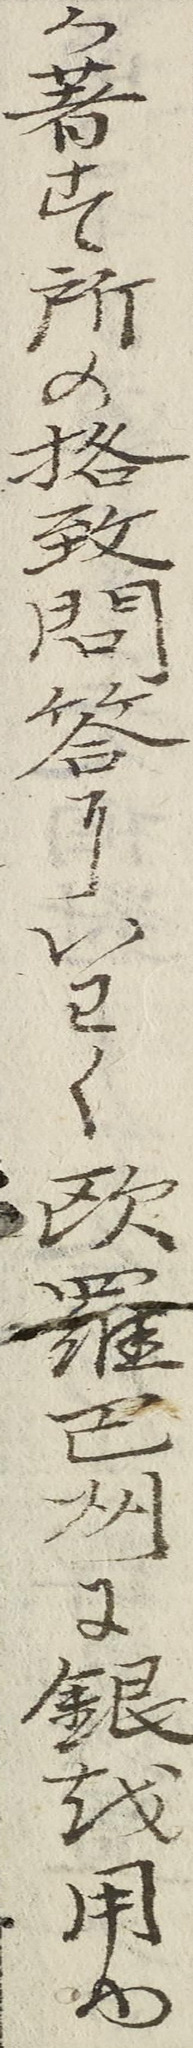著す所の挌致問答にいわく欧羅巴州に銀を用ゆ
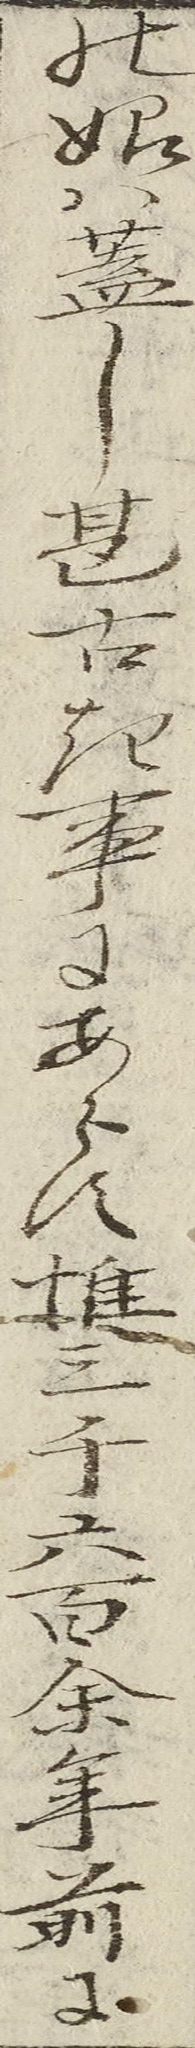の始ハ蓋し甚古き事にあらす推三千六百余年前に
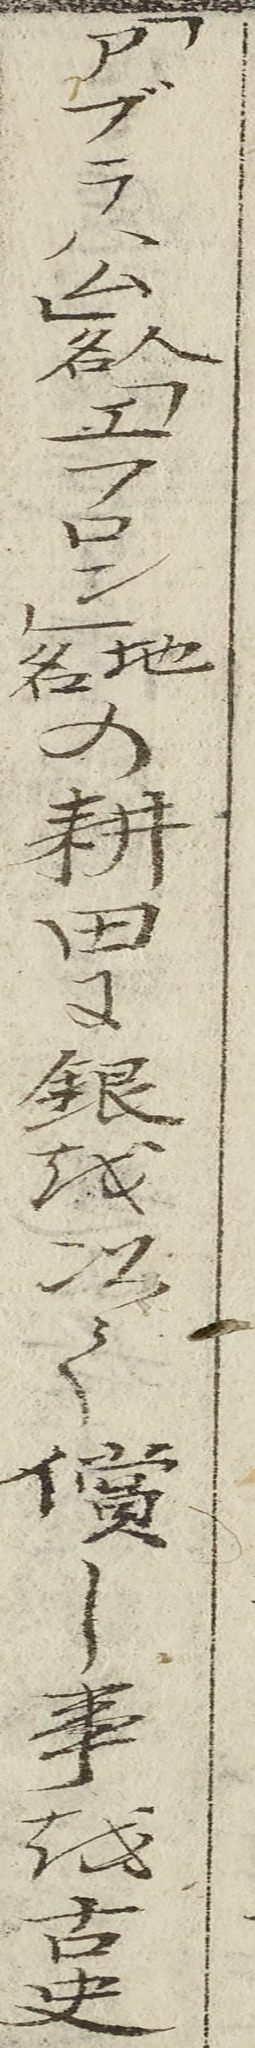「アブラハム」人名の耕田に銀を以て償し事を古史
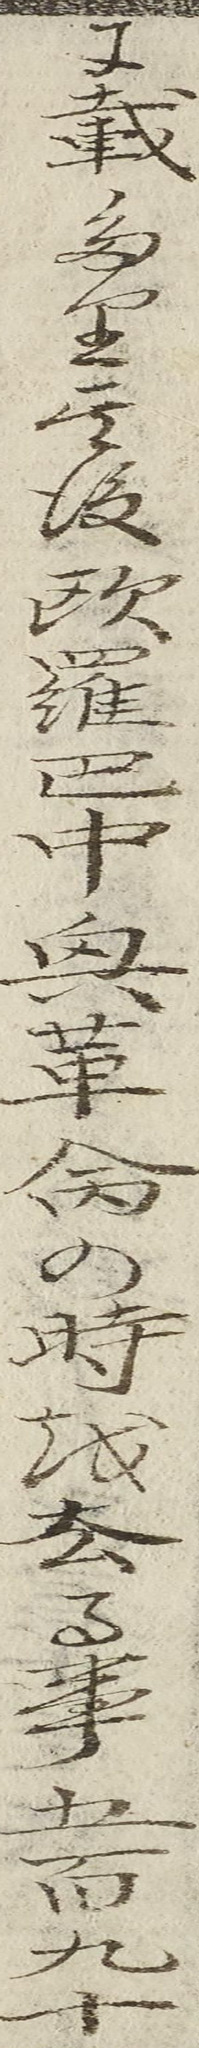に載たり其後欧羅巴中奥革命の時を厺る事五百九十
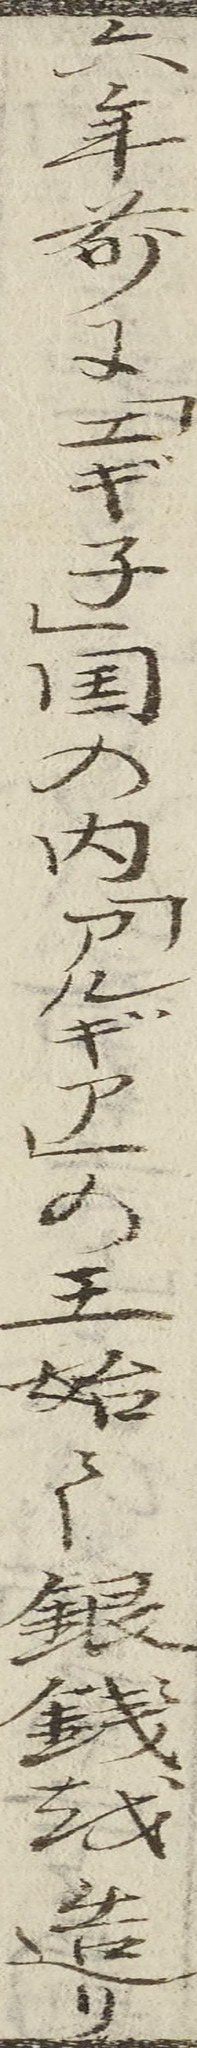六年前に「エギ子」国の内「アルギア」の王始て銀銭を造り
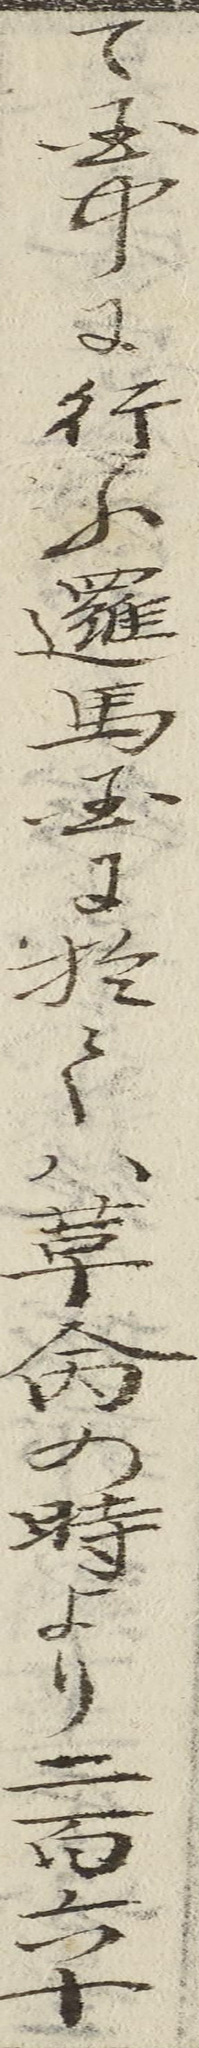て国中に行ふ邏馬国に於てハ革命の時より二百六十
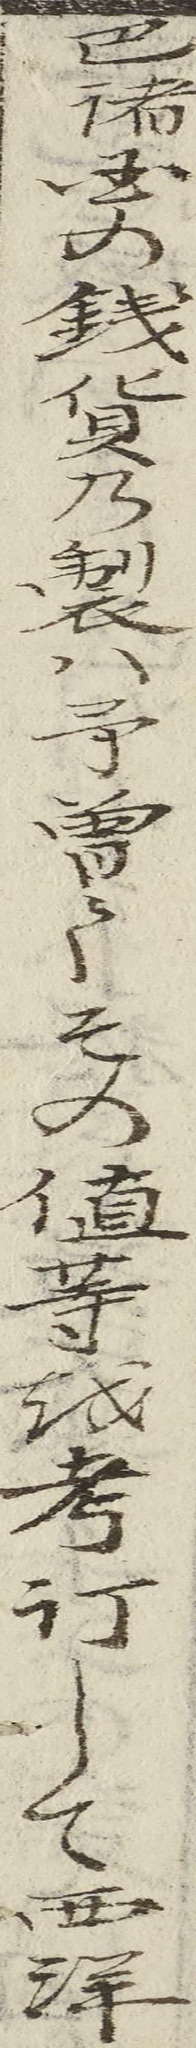巴諸国の銭貨の製は予曾てその値等を考訂して西洋
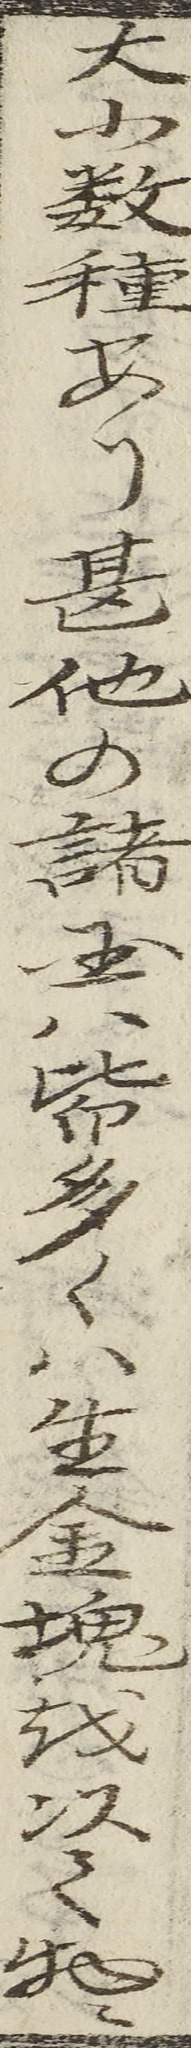大小数種あり甚他の諸国ハ皆多くハ生金塊を以て物二

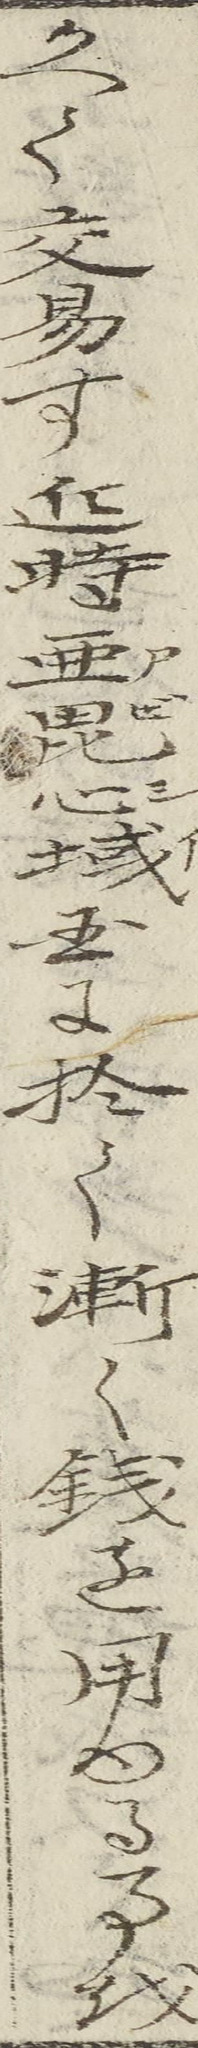かへて交易す近時亜毘心域国に於て漸く銭を用ゆる事を
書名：西洋雜記　坤
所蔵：東京大学地震研究所図書室 Earthquake Research Institute Library, The University of Tokyo, JAPAN
